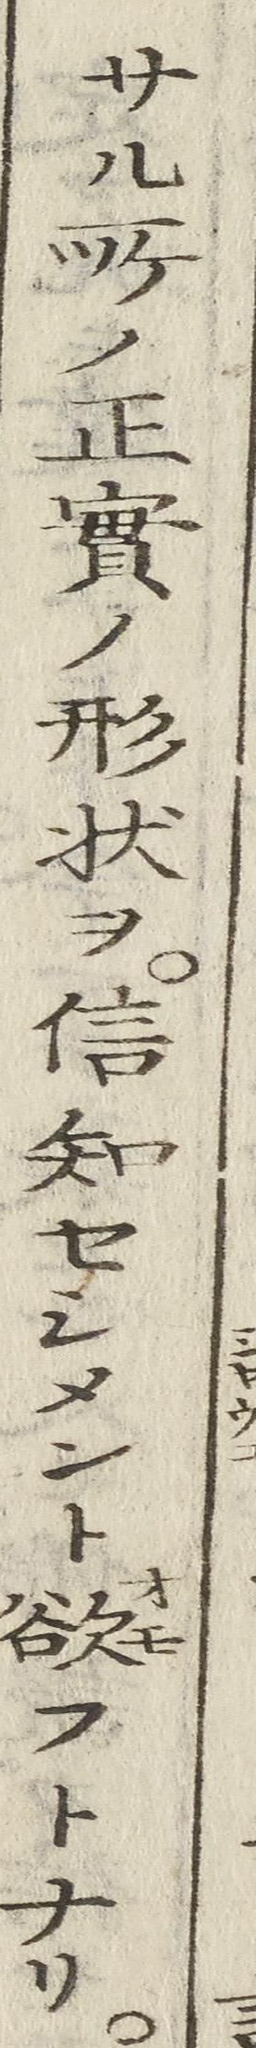サル所ノ正実ノ形状ヲ。信知セシメント欲フトナリ。
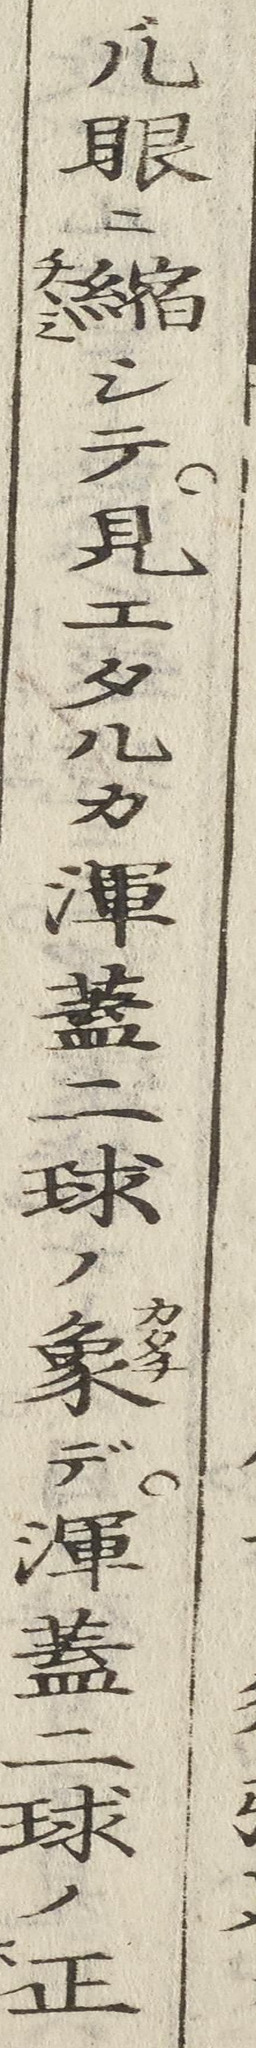凡眼ニ縮シテ。見エタルカ渾蓋二球ノ象デ。渾蓋二球ノ正
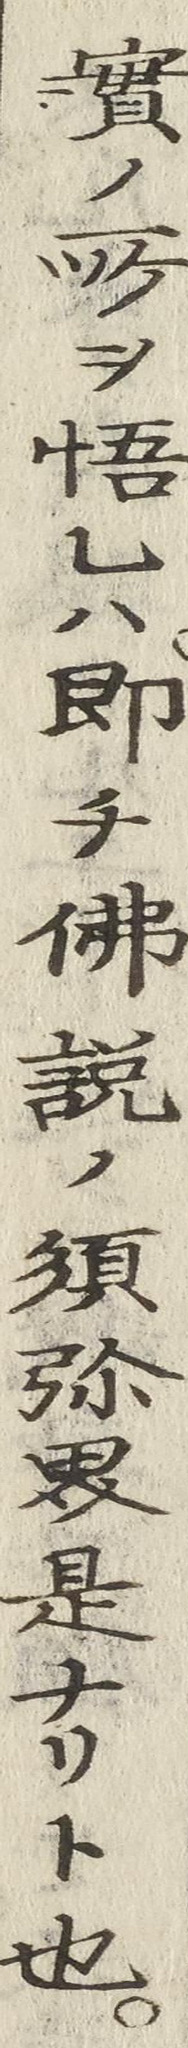実ノ所ヲ悟レハ。即チ仏説ノ須弥界是ナリト也。
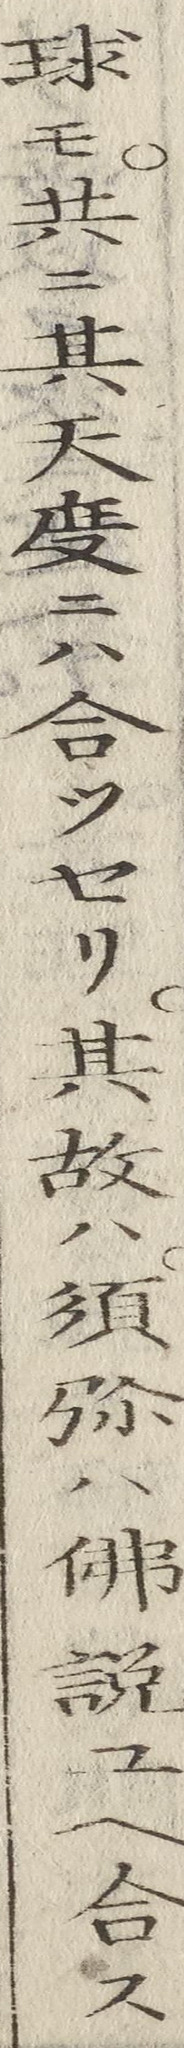球モ。共ニ其天度ニハ合ツセリ。其故ハ。須弥ハ仏説ユヘ。合ス
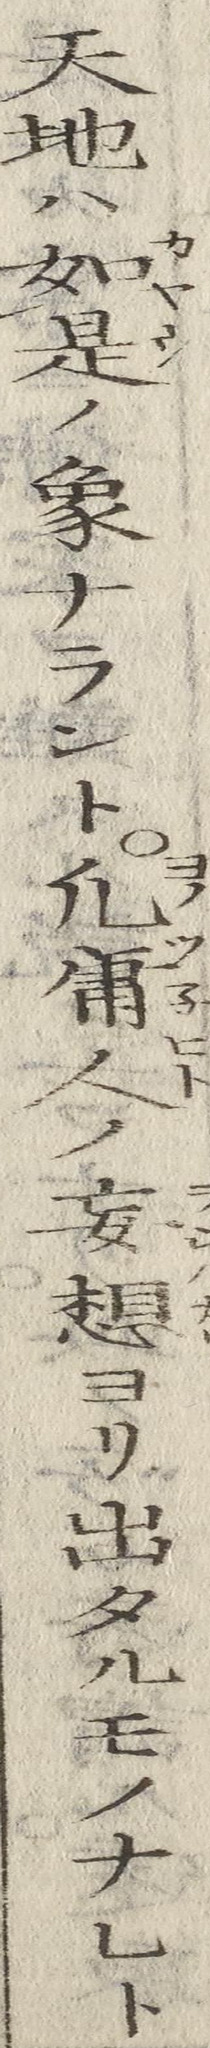天地ハ如是ノ象ナラント。凡庸人ノ妄想ヨリ出タルモノナレト
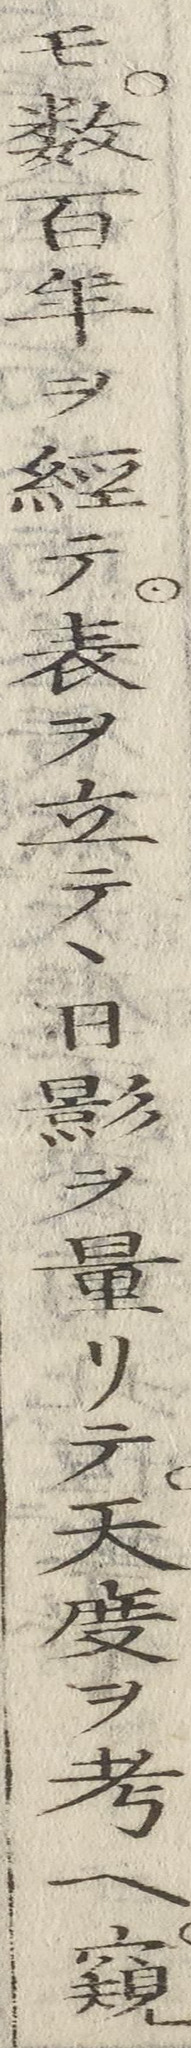モ。数百年ヲ経テ。表ヲ立テヽ日影ヲ量リテ。天度ヲ考ヘ。窺
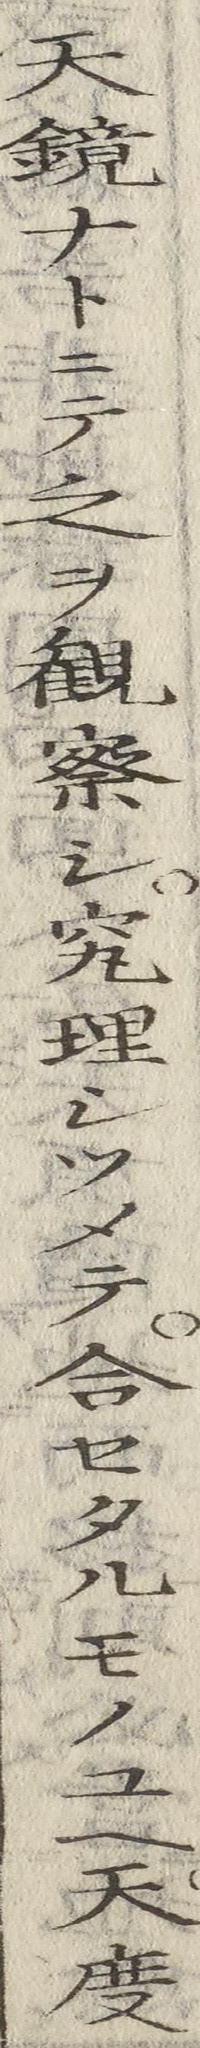天鏡ナトニテ之ヲ観察シ。究理シツメテ。合セタルモノユヘ。天度
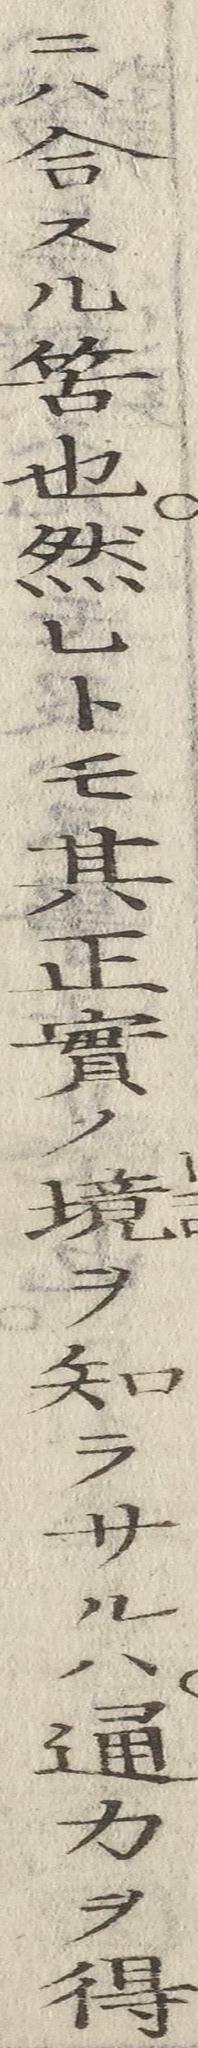ニハ合スル筈也。然レトモ其正実ノ境ヲ知ラサルハ。通力ヲ得
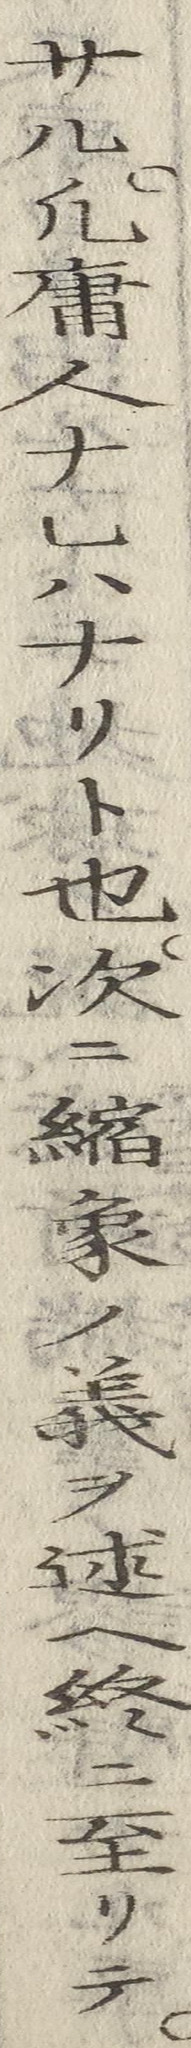サル。凡庸人ナレハナリト也。次ニ縮象ノ義ヲ述ヘ終ニ至リテ。

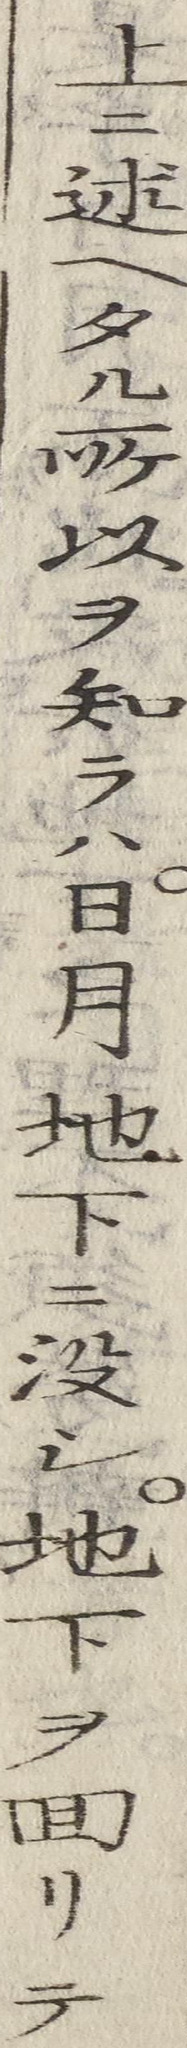上ニ述ヘタル所以ヲ知ラハ。日月地下ニ没シ。地下ヲ回リテ
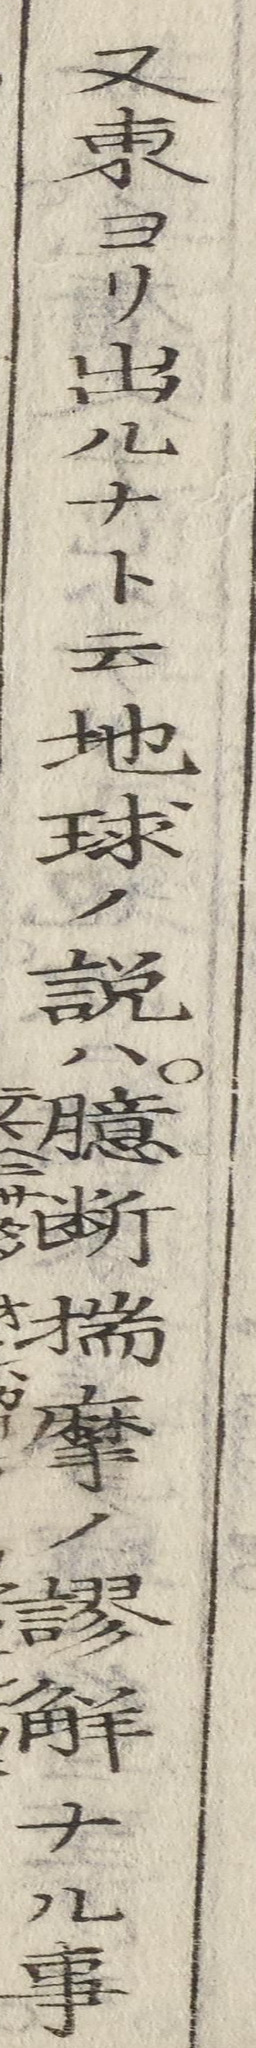又東ヨリ出ルナト云地球ノ説ハ。臆断揣摩ノ謬解ナル事
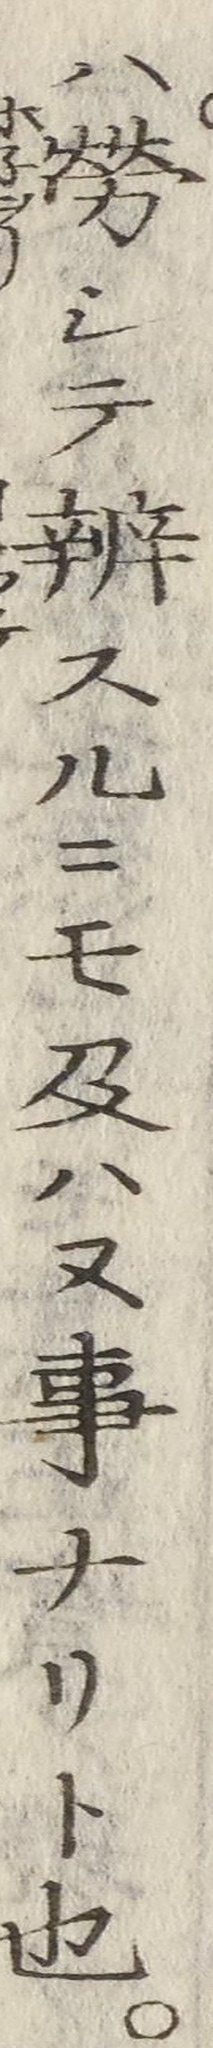ハ。労シテ弁スルニモ及ハヌ事ナリト也。
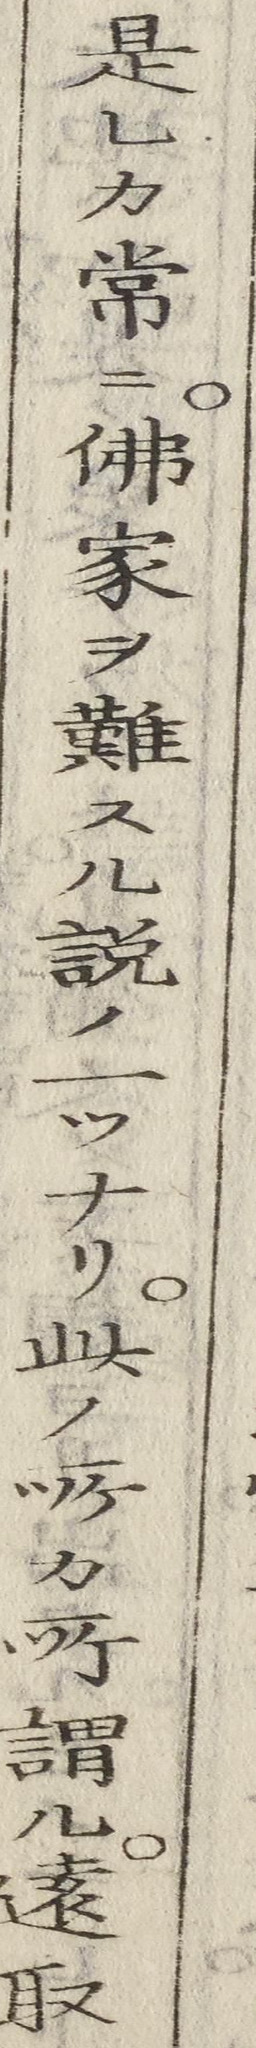是レカ常。仏家ヲ難スル説ノ一ツナリ。此ノ所カ所謂ル。遠取
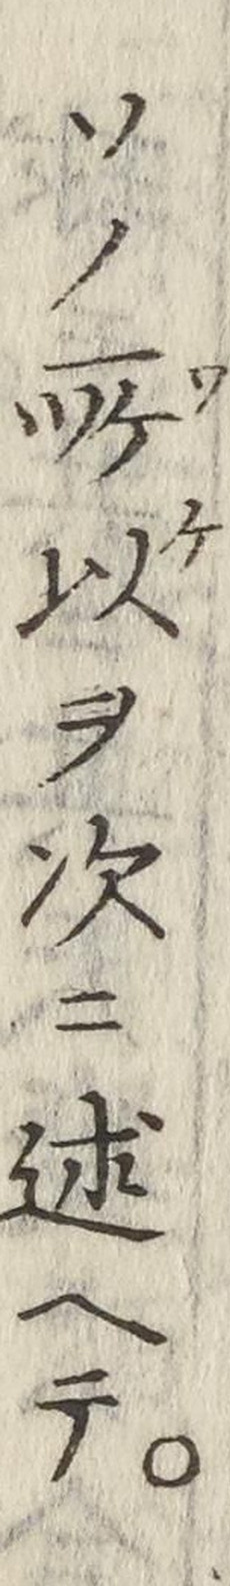ソノ所以ヲ次ニ述ヘテ。
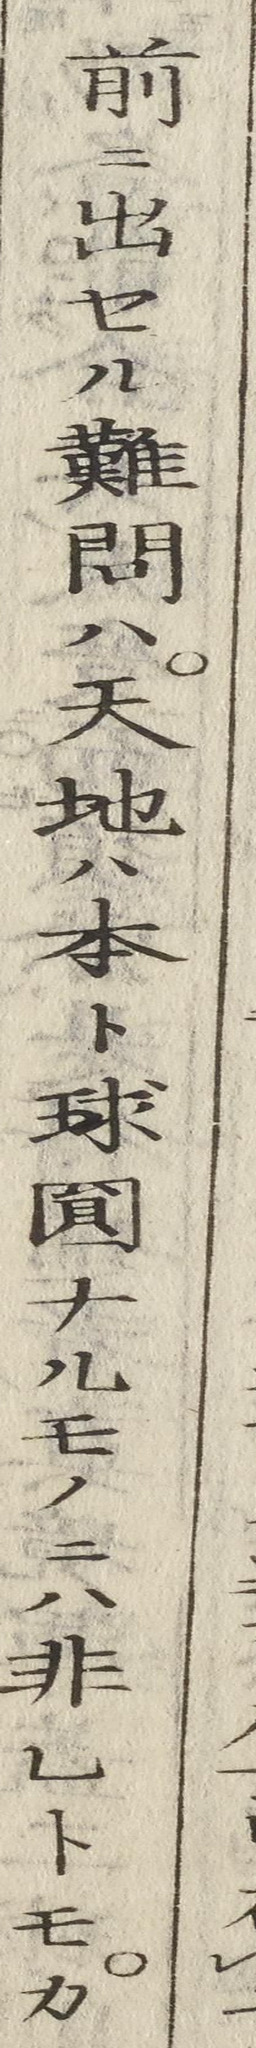前ニ出セル難問ハ。天地ハ本ト球円ナルモノニハ非レトモ。カ
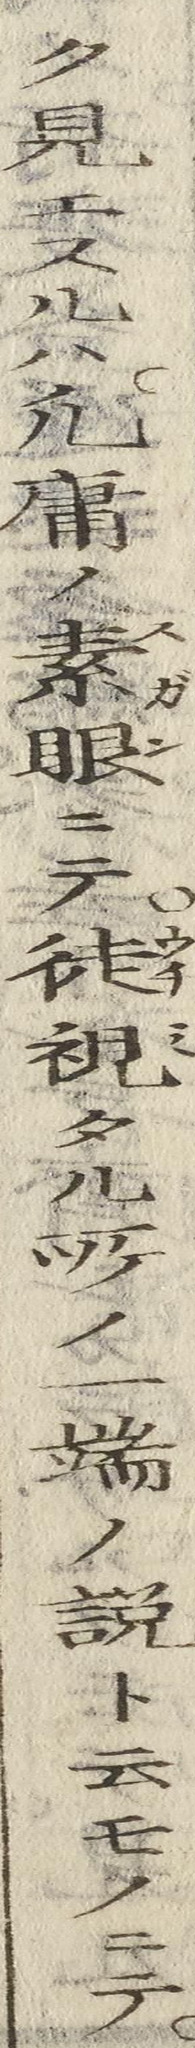タ見エスルハ。凡庸ノ素眼ニテ。徒視タル所ノ一端ノ説ト云モノニテ。
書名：護法新論　上
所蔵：東京大学地震研究所図書室 Earthquake Research Institute Library, The University of Tokyo, JAPAN
